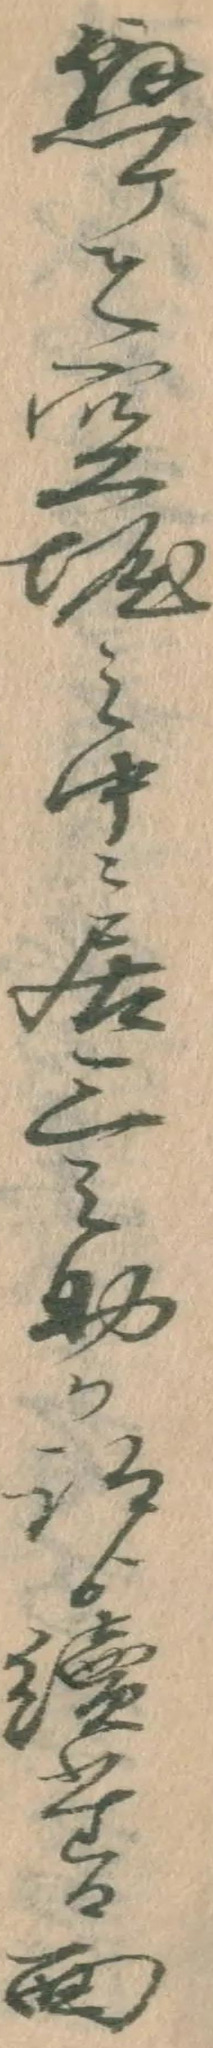懸けて空堀之中に居三之助か跡ゟ続堂る面
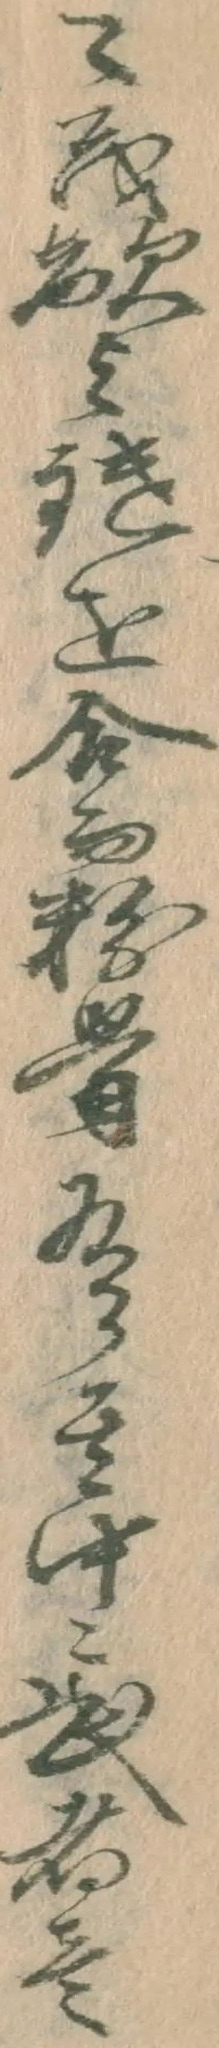に茂敵与鑓を合而粉骨有り其中に武者壱
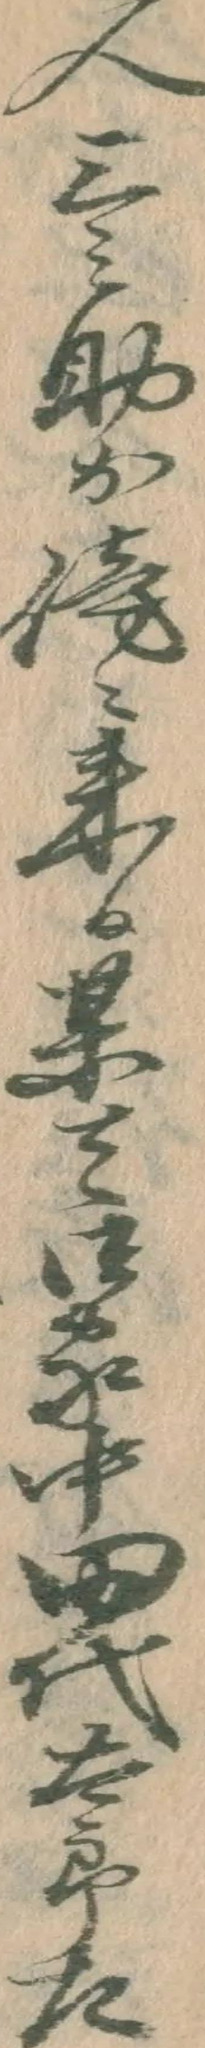人三之助か傍に来る某を御家中田代太郎左
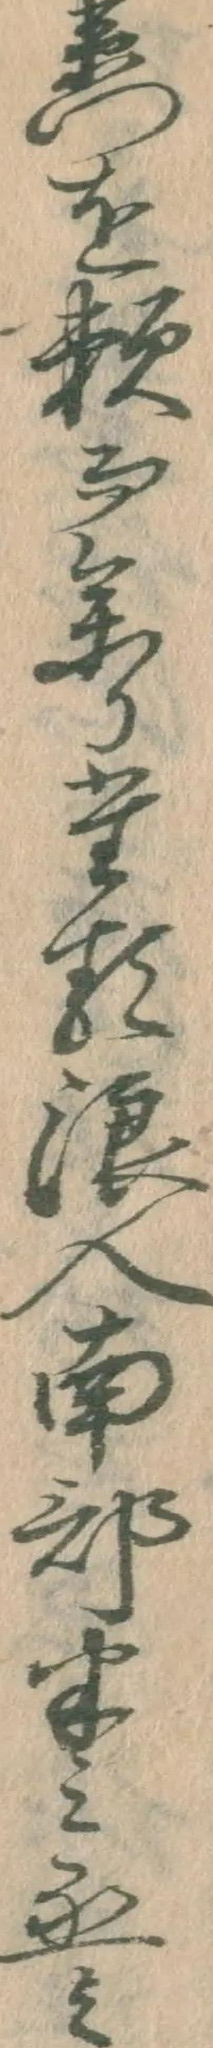衛門を頼而参り堂類浪人南部半之丞与
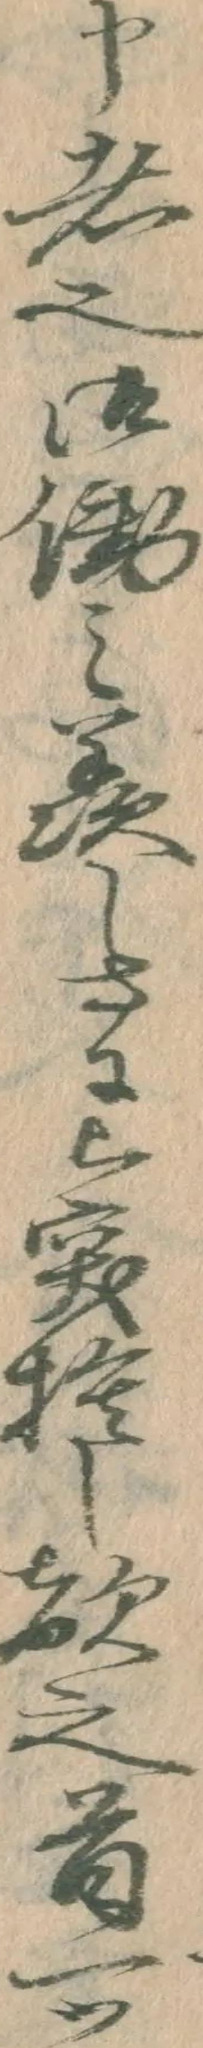申者也御働之羨しさ尓被突捨し敵之首一つ
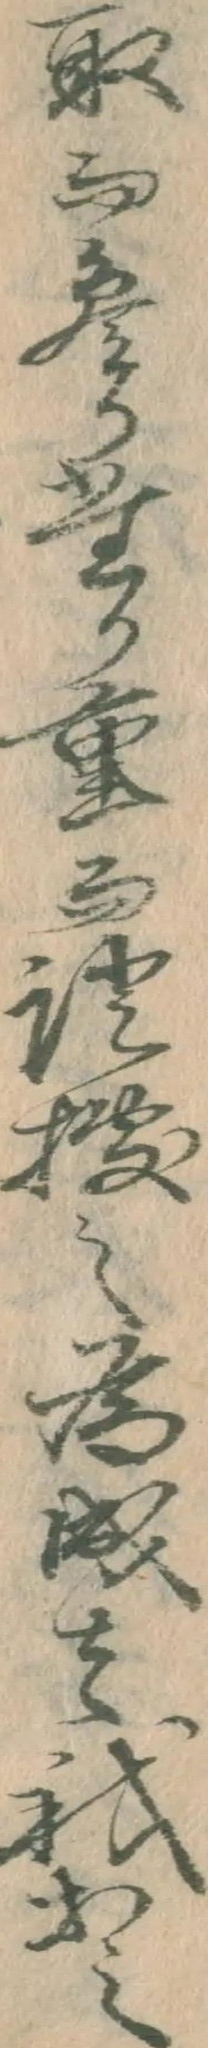取而参り堂り重而証拠之為成者我等之
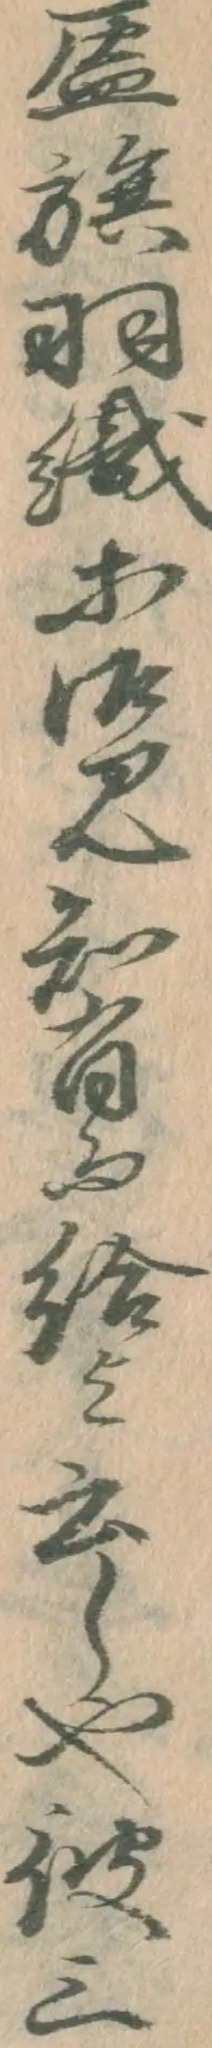盔旗羽織等御見知有而給与云しや彼三

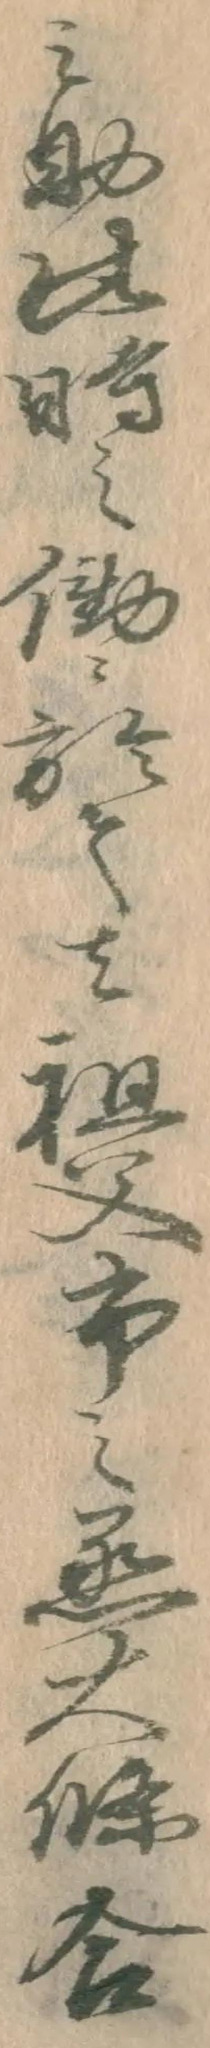之助此時之働に於て者祖父市之丞大條合
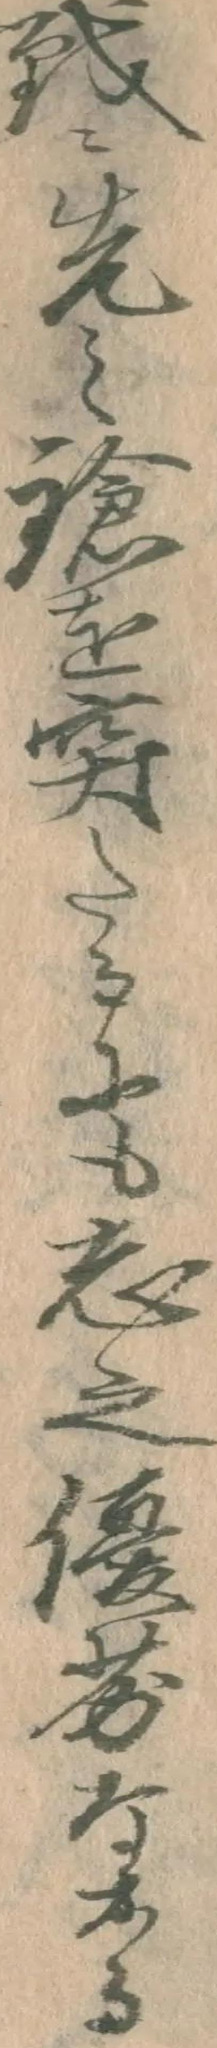戦に先之鎗を突たる尓も志之優芬なかる
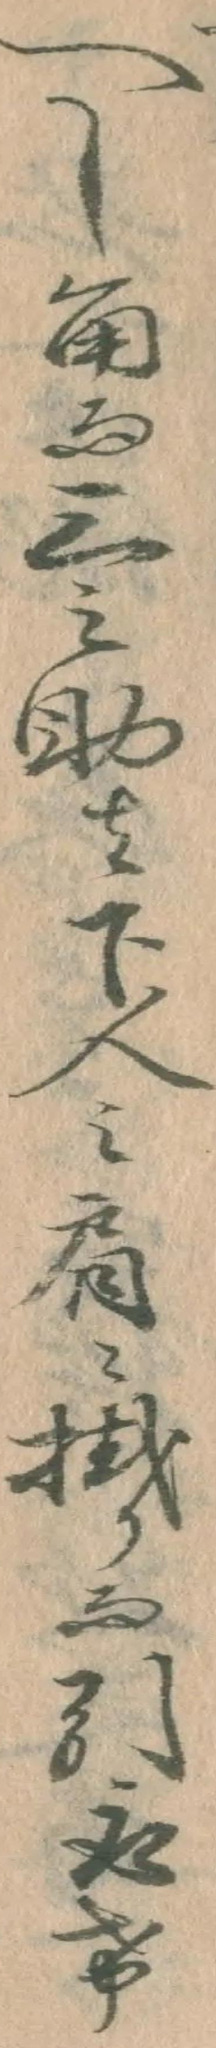へし角而三之助者下人之肩に掛り而引取希
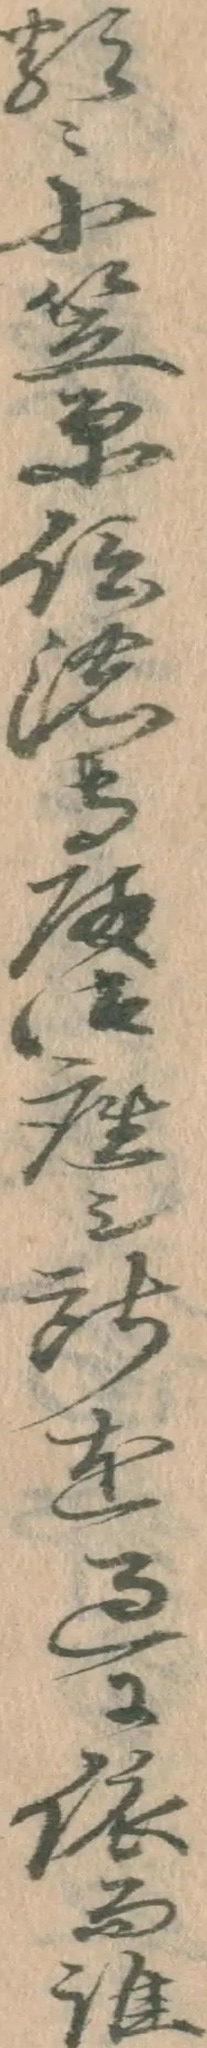類に小笠原信濃守殿御座し所を過尓依而誰
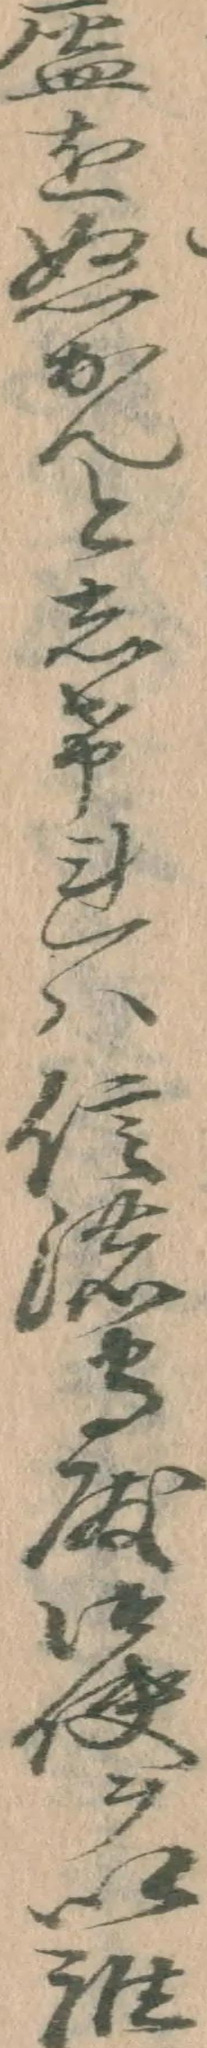盔を怒かんと志希連は信濃守殿御使を以誰
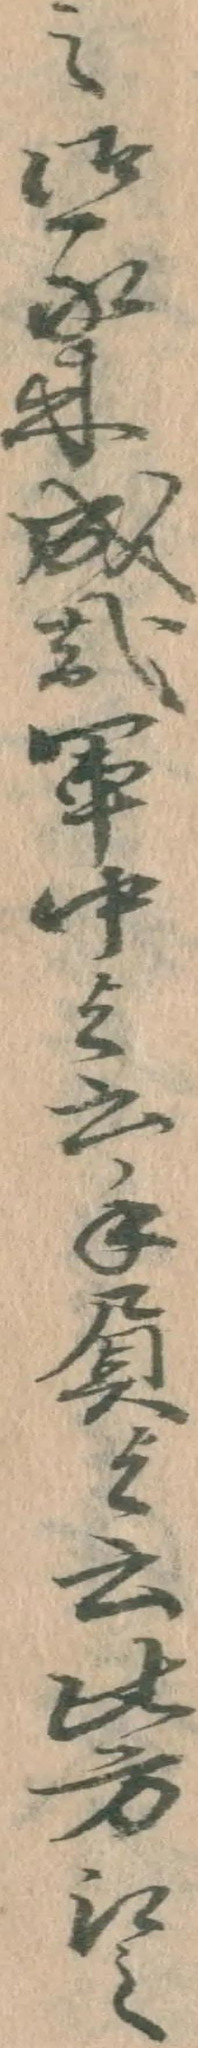之御家来成哉軍中与云手負与云此方江之
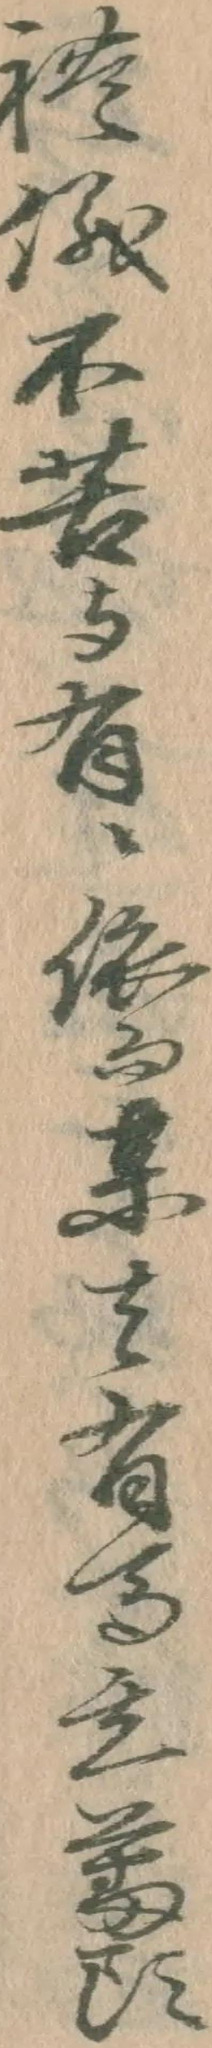禮儀不苦与有に依而某者有馬玄蕃頭
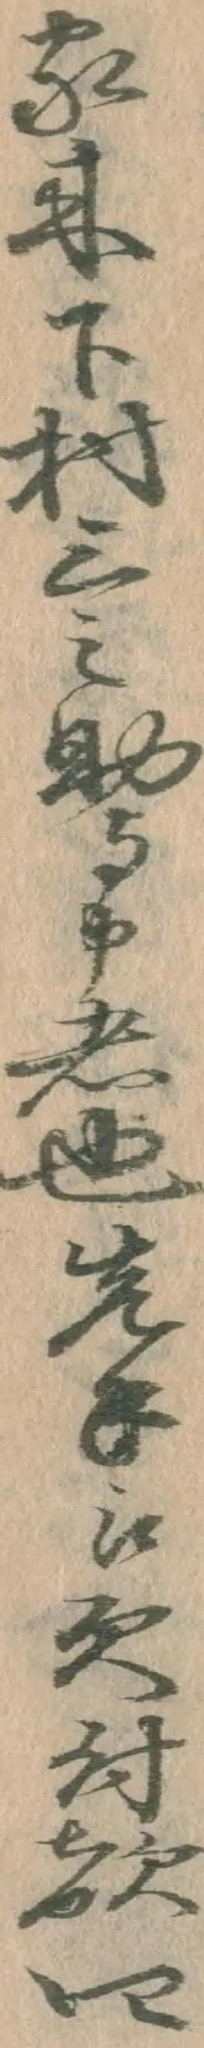家来下村三之助与申者也先手江欠付敵四
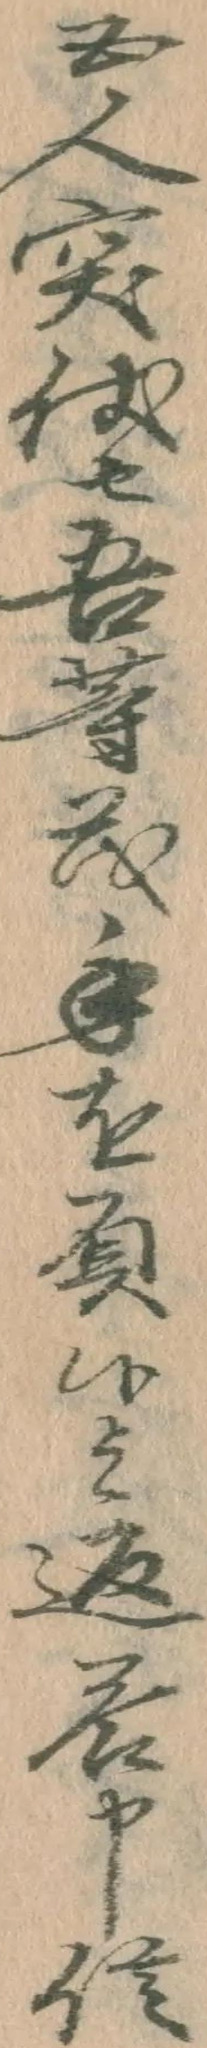五人突伏せ吾等茂手を負候与返答申信
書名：切支丹御退治記 49巻. [8]
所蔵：国立国会図書館 National Diet Library, JAPAN
